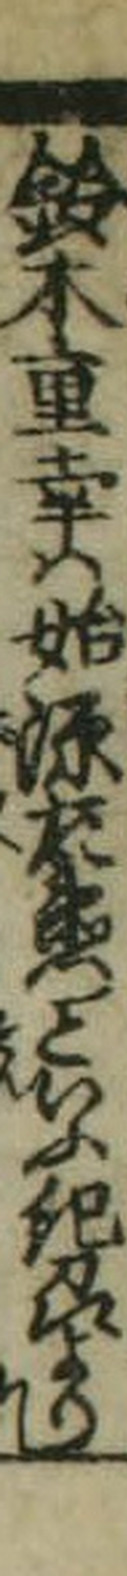鈴木重幸は始源左衛門といふ紀州より
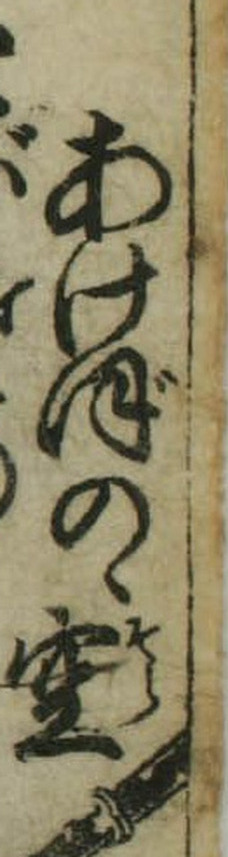あけぼのゝ空
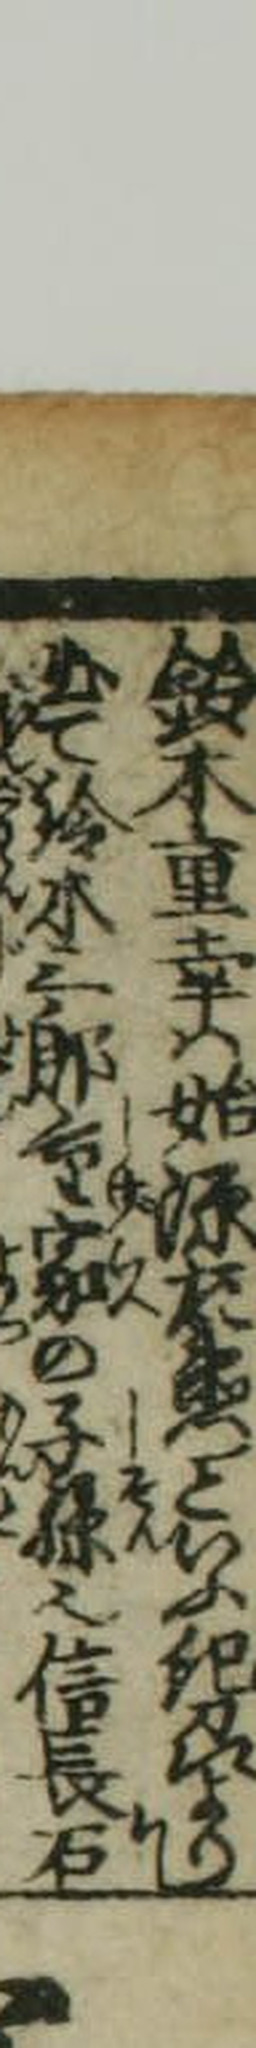出て鈴木三郎重家の子孫也信長石
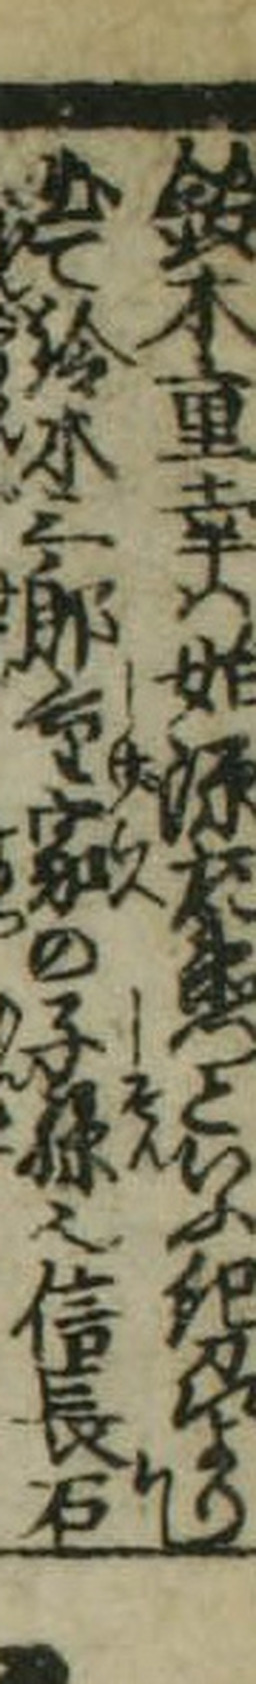出て鈴木三郎重家の子孫也信長石
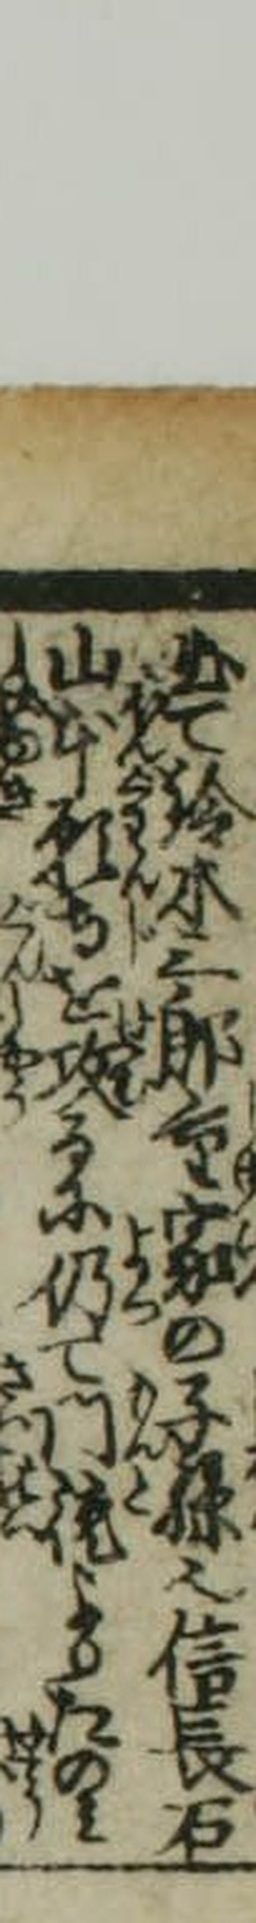山本願寺を攻るに仍て門徒よりたのみ
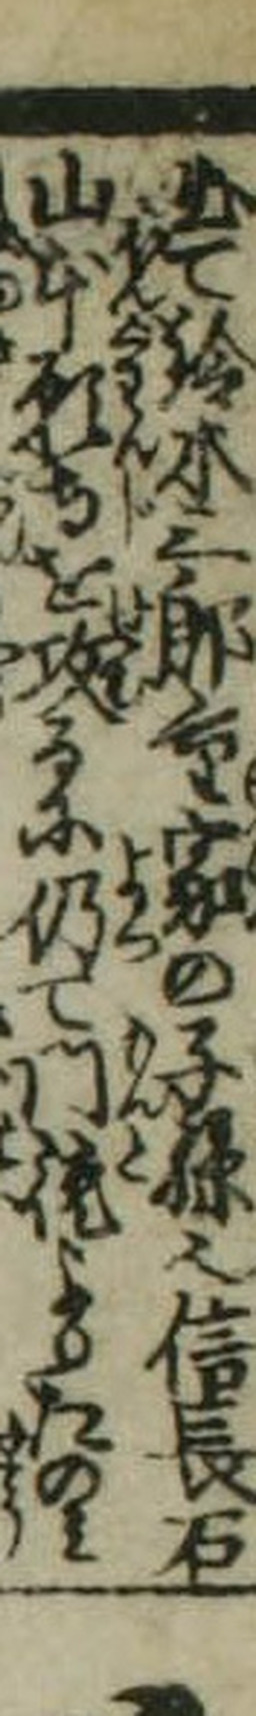山本願寺を攻るに仍て門徒よりたのみ
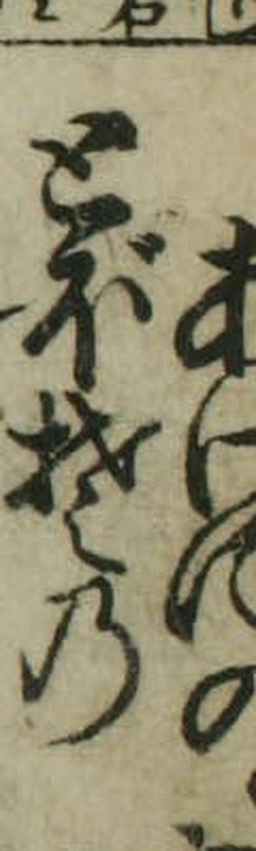とぼその
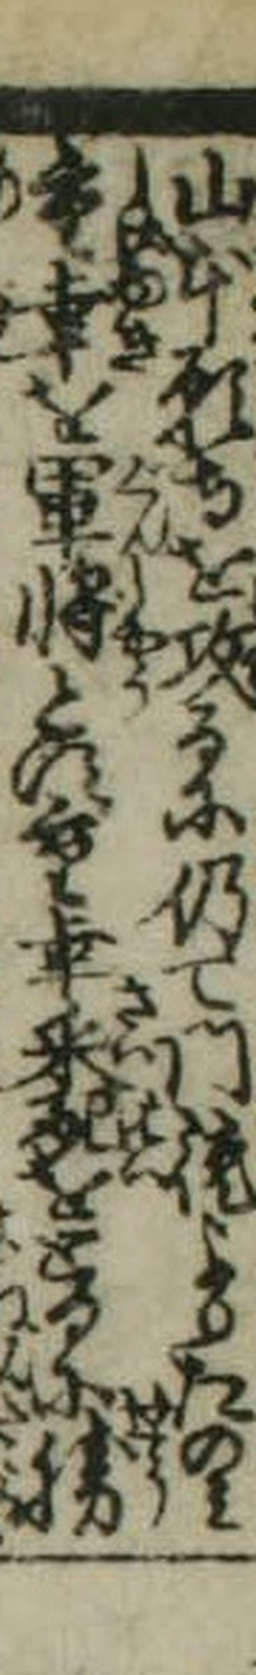重幸を軍将とす重幸采配をとるに勝
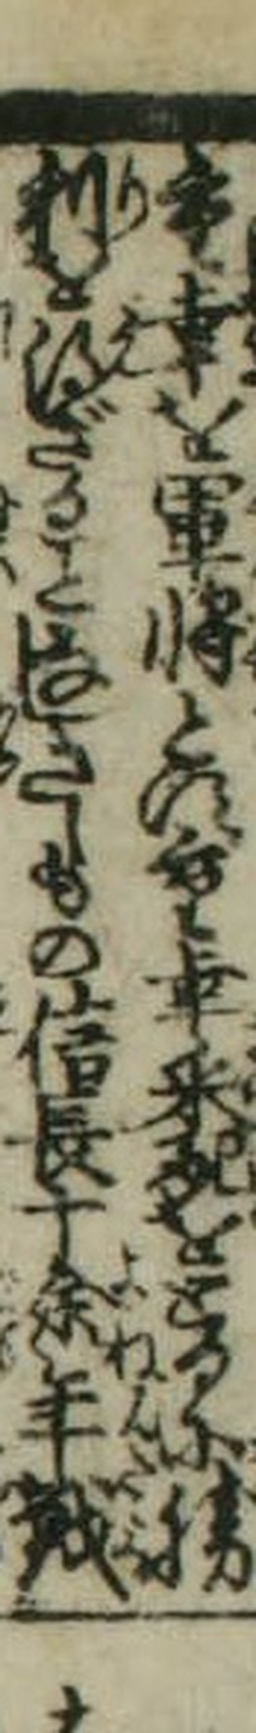利を得ざることなしさしもの信長十余年戦
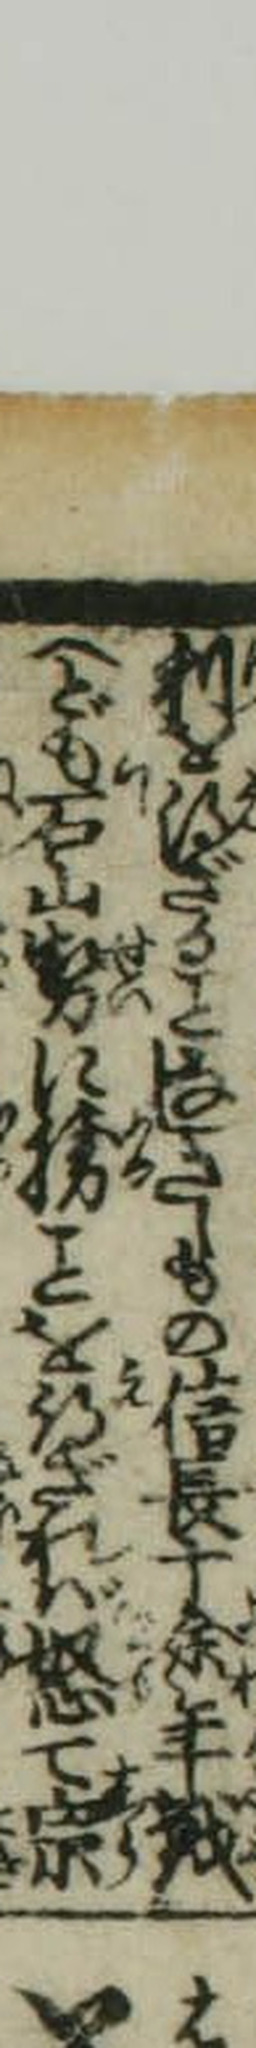へども石山勢に勝ことを得ざれば怒て宗
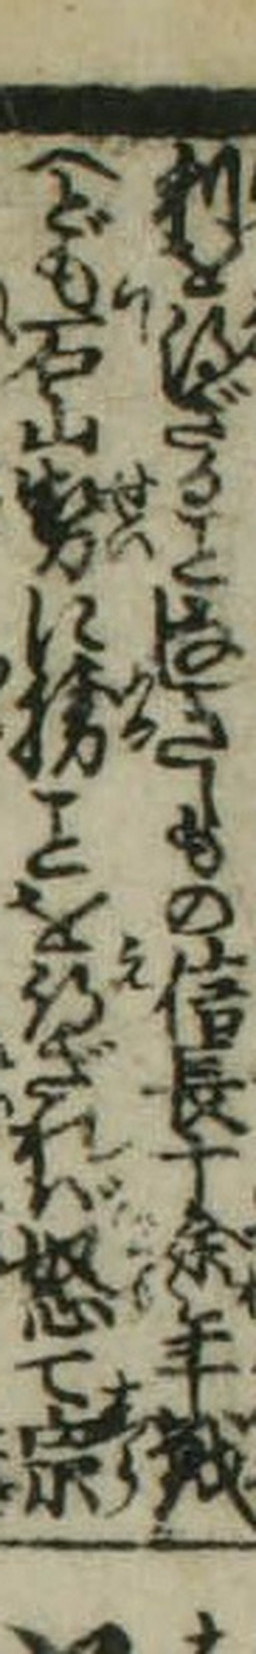へども石山勢に勝ことを得ざれば怒て宗
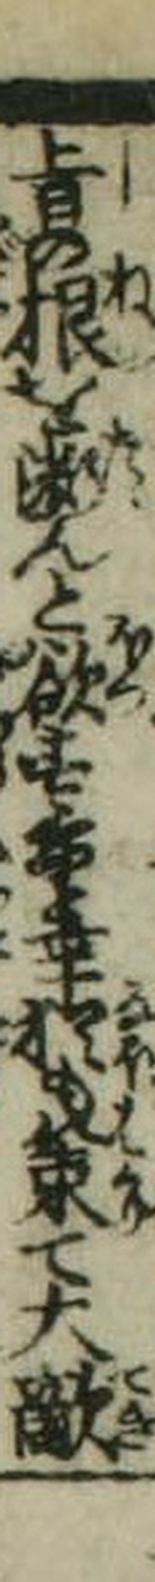旨の根を断んと欲す重幸猶も策て大敵
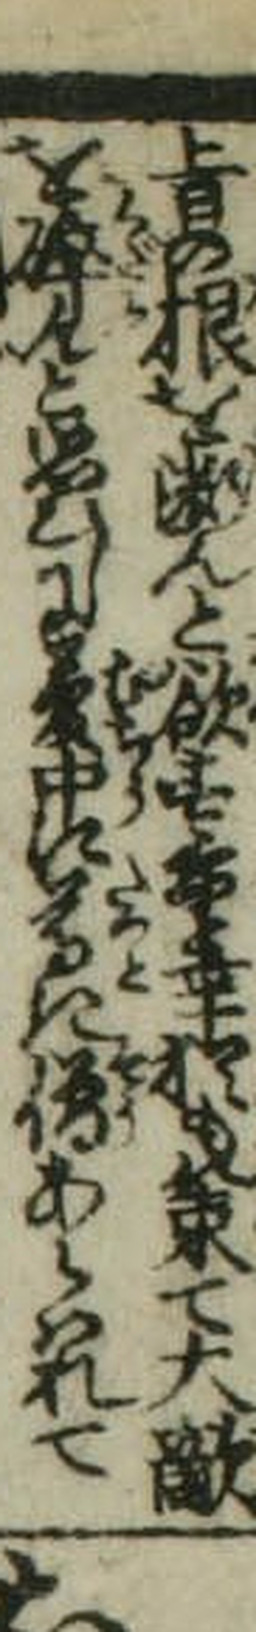を碎んと思ひしに夢中に尊き僧あらはれて
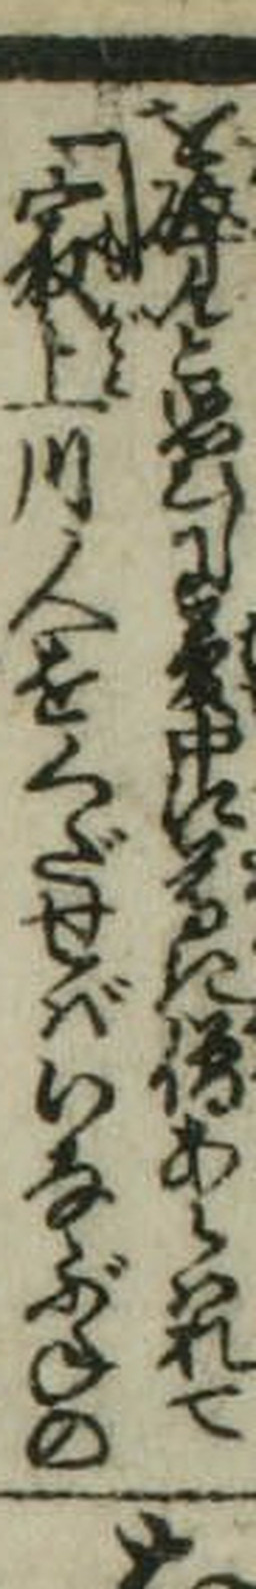〽最上川人をくだせばいなぶねの
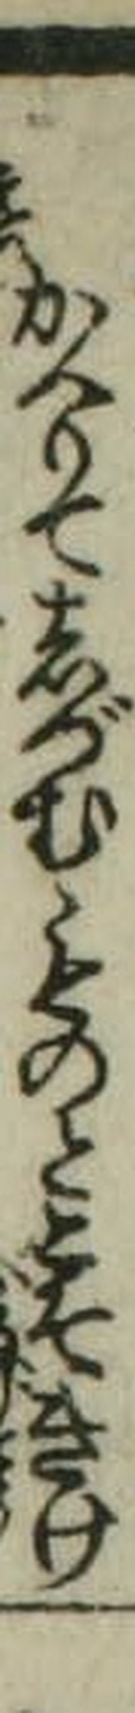かへりてしづむものとこそきけ
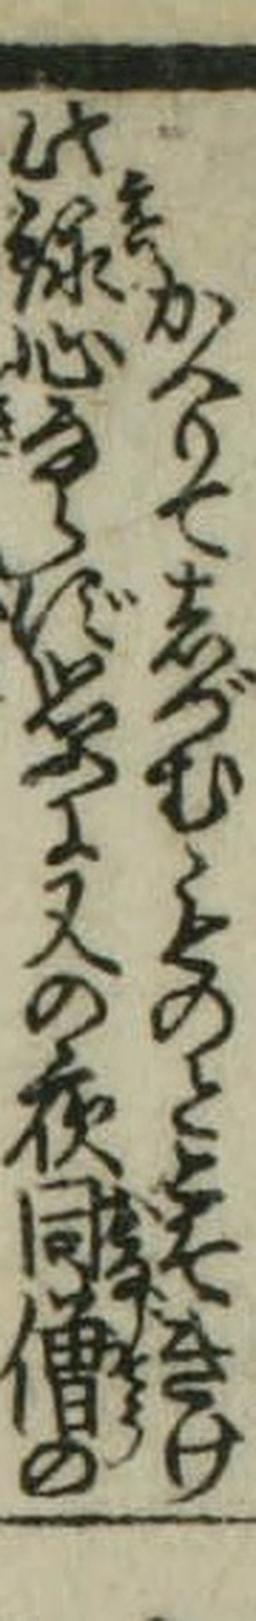此縁心ならず思ふに又の夜同僧の
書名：續英雄百人一首
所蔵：東京学芸大学附属図書館
